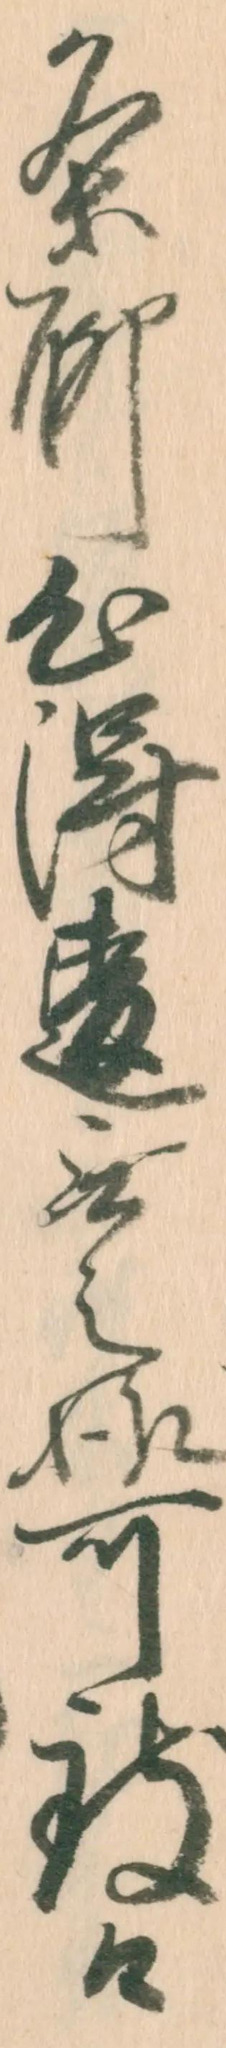条聊心得違無之様可致候
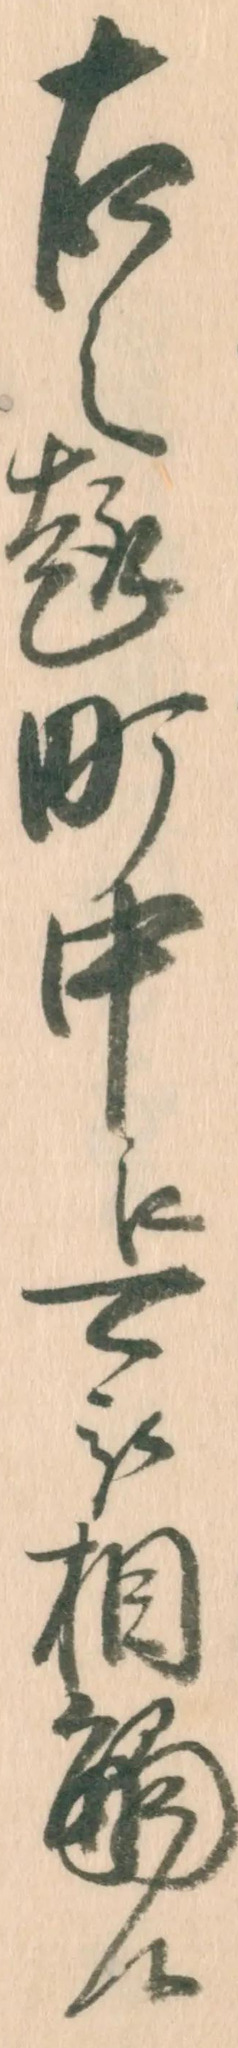右之趣町中え可被相触候
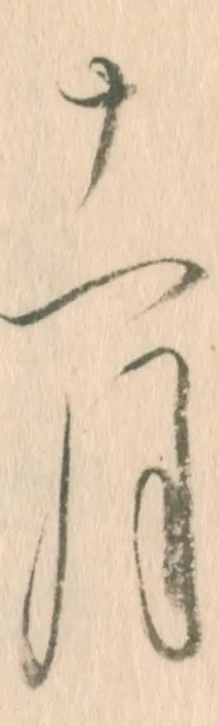十一月

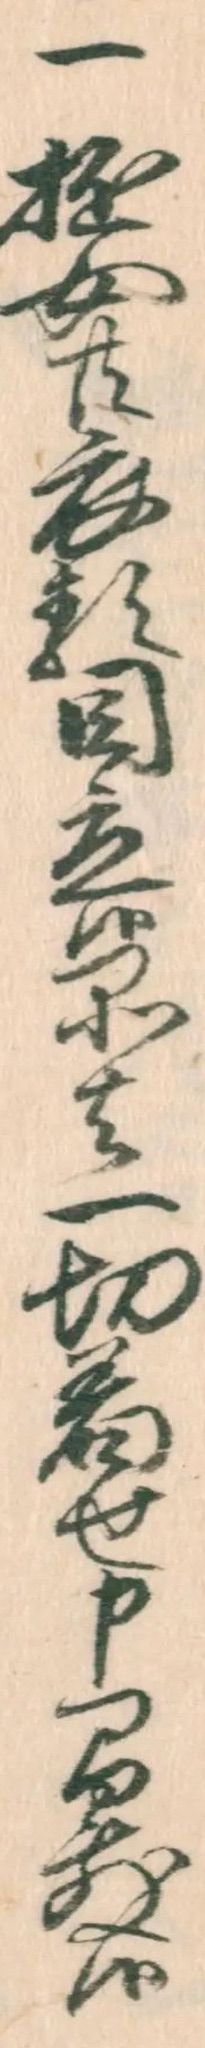一遊女共衣類目立候品は一切着せ申間敷候
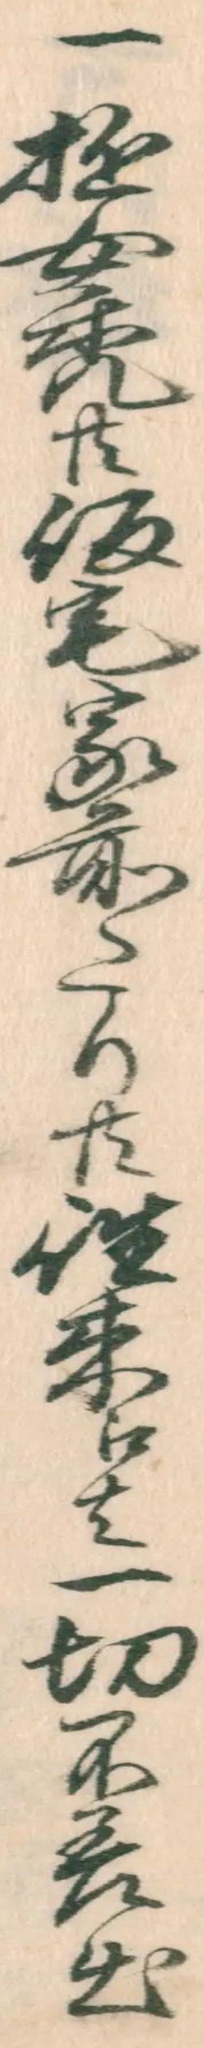一遊女禿共仮宅家前たり共往来えは一切不差出
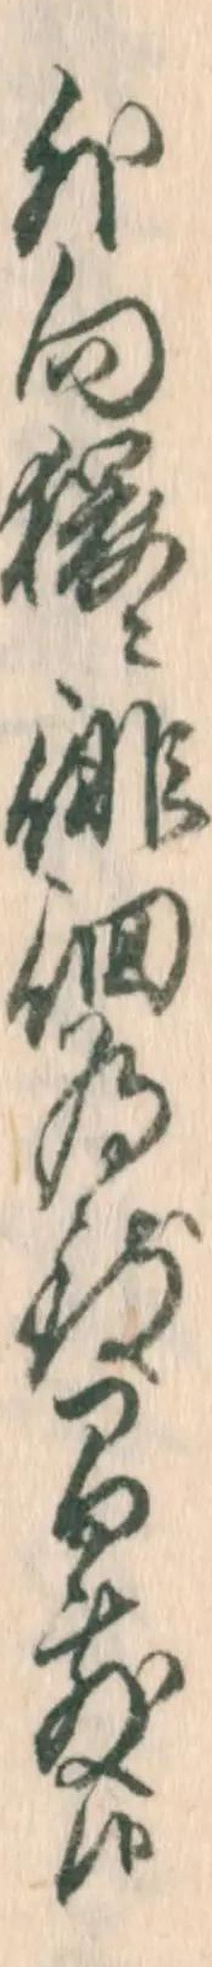外向猥ニ徘徊為致間敷候
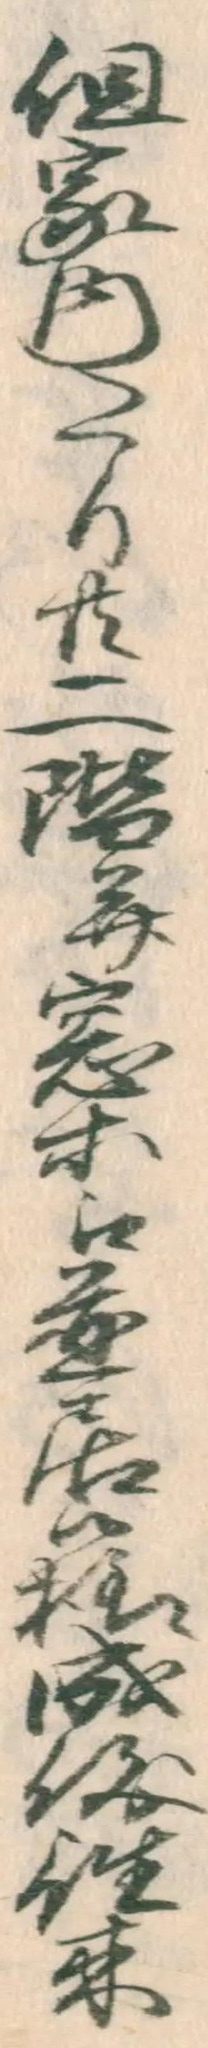但家内たり共二階幷窓等え並居候様成儀往来
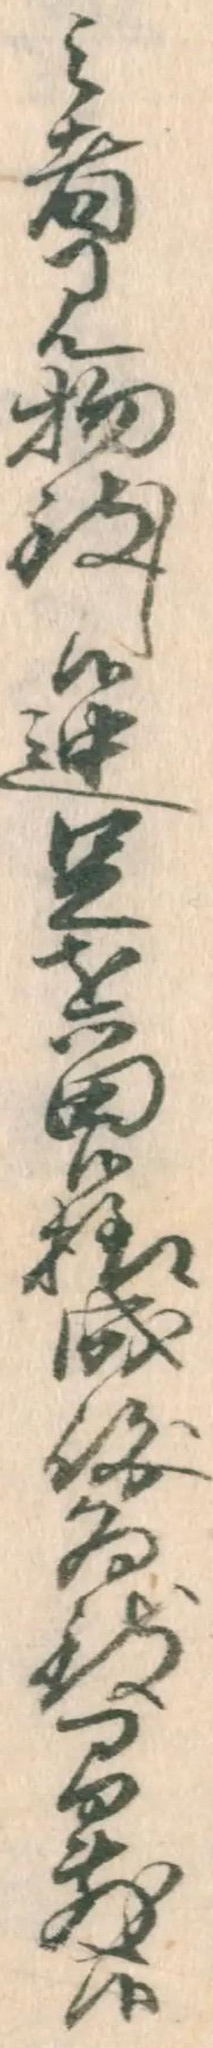之者見物致し候迚足を留候様成儀為致間敷候
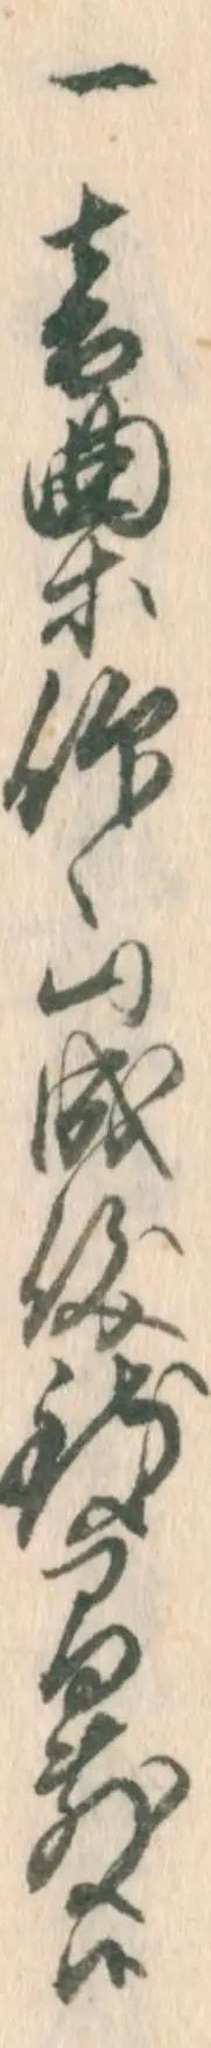一音曲等仰山成儀致間敷候

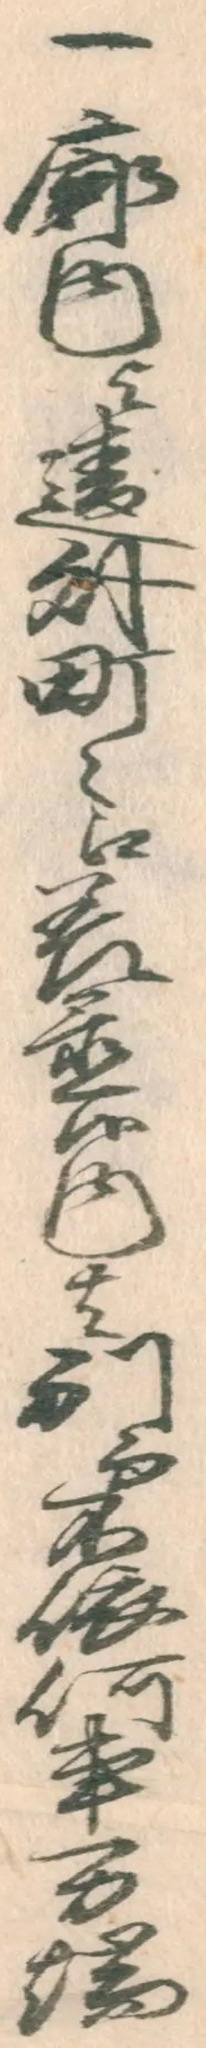一廓内と違外町〻え差置候内は別て不依何事万端
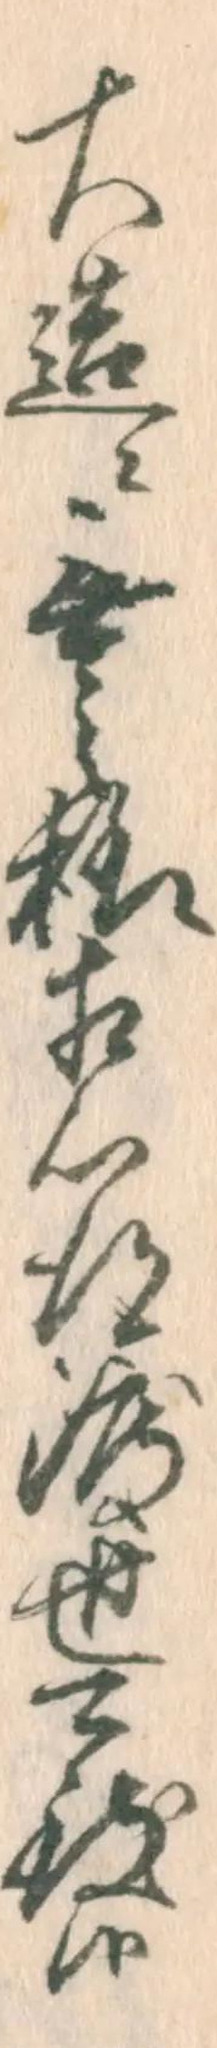大造ニ無之様相心得渡世可致候
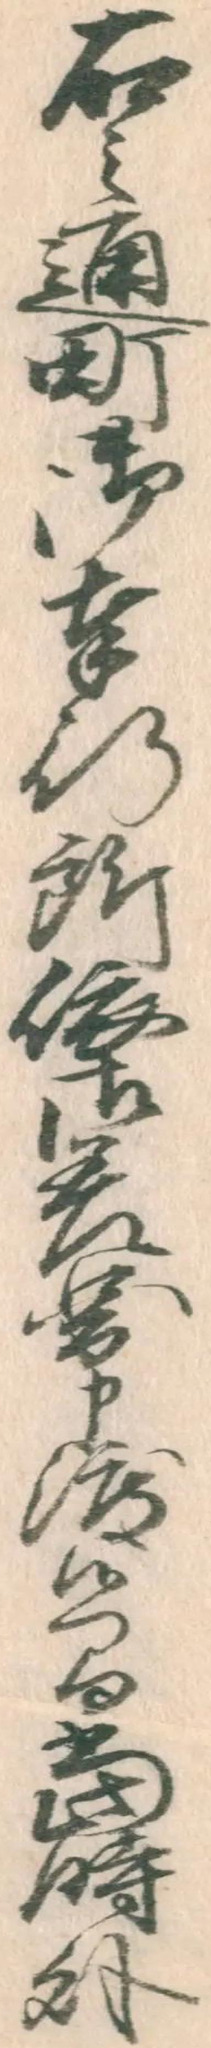右之通町御奉行所依御指図申渡候間当時外
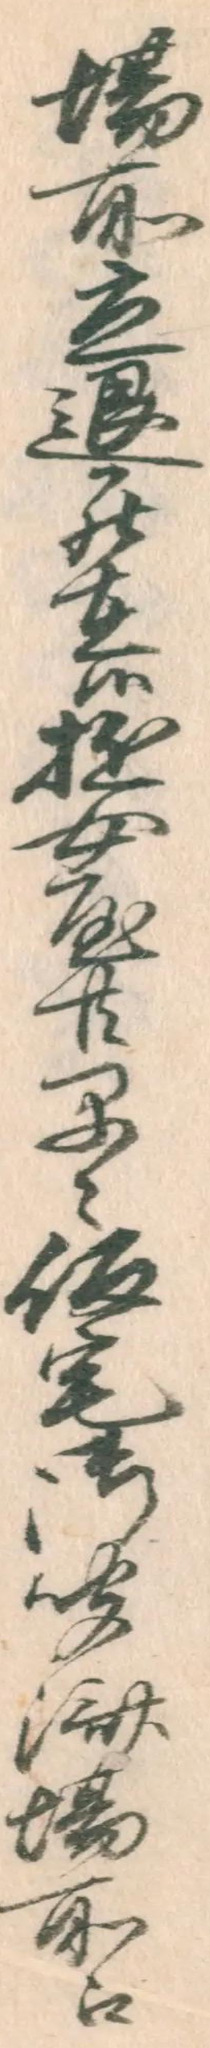場所立退罷在候遊女屋共早〻仮宅御聞済場所え
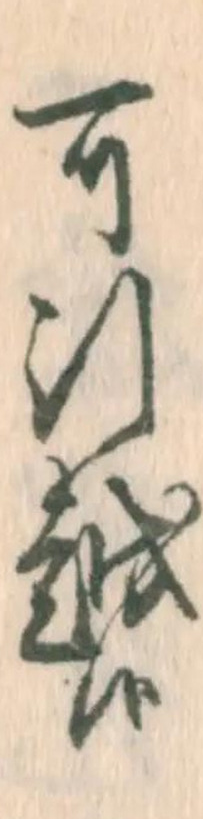可引越候
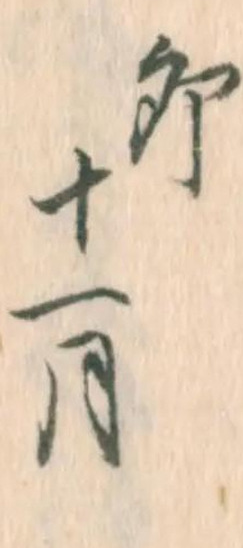卯十一月
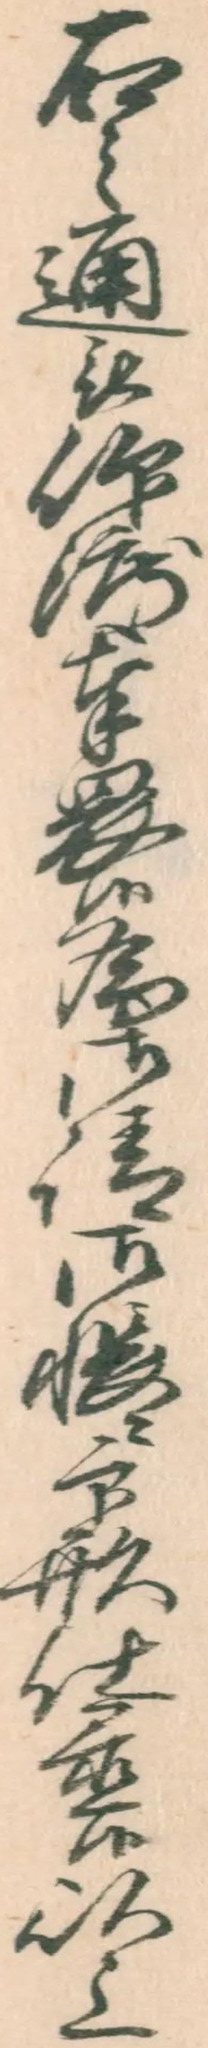右之通被仰渡奉畏候為御請御帳ニ印形仕置候以上
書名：地震災書留 2巻. [2] 内表紙に「地震一件　安政二卯年十月」とあり
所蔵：国立国会図書館 National Diet Library, JAPAN
